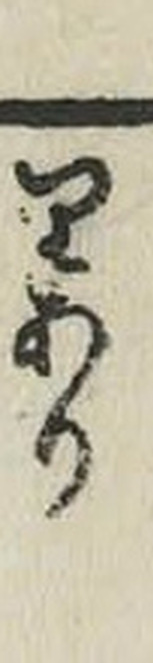りあり
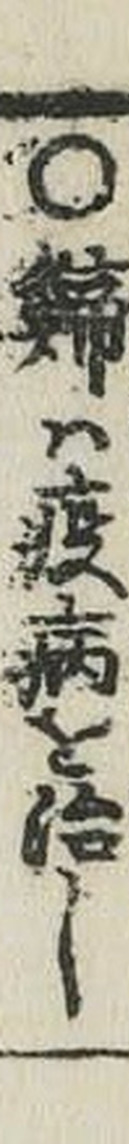○䱱は疫病を治し
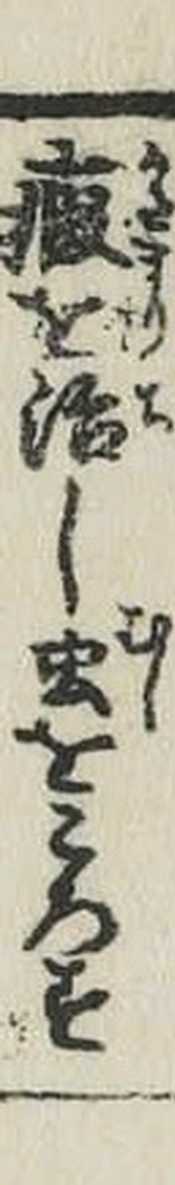瘕を治し虫をころす
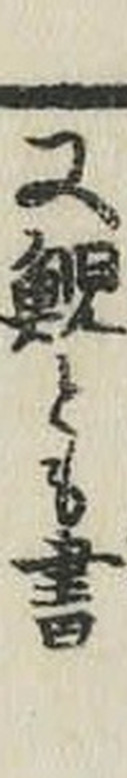又鯢とも書
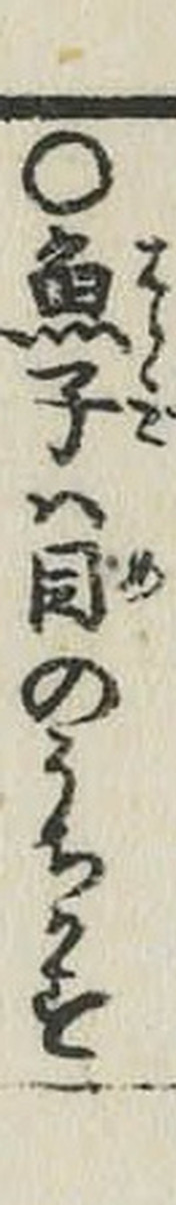○魚子は目のうちかす
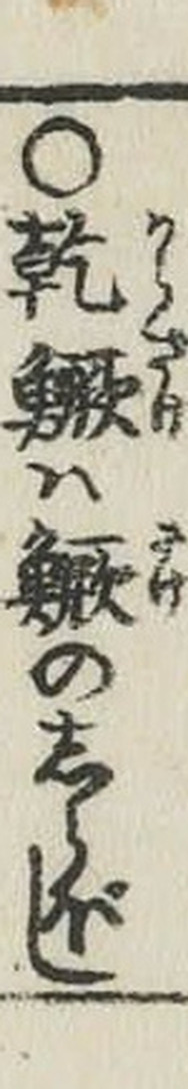○乾鱖は鱖のしらぼし
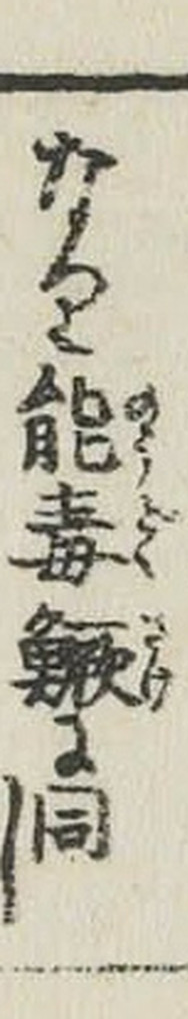なり能毒鱖に同し
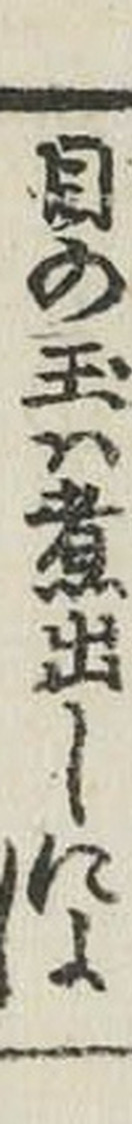目の玉は煮出しによし
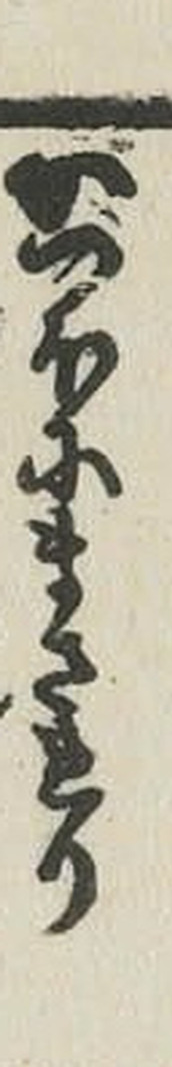かつほにまされり
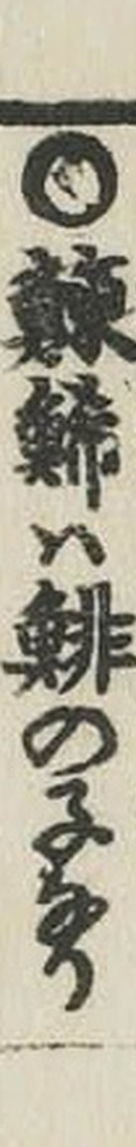○鯟鯑は鯡の子なり
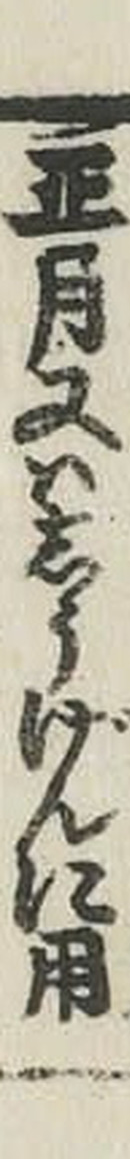正月又はしうげんに用
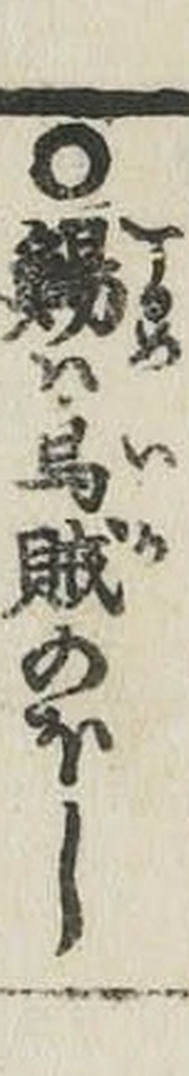○鰑は烏賊のほし
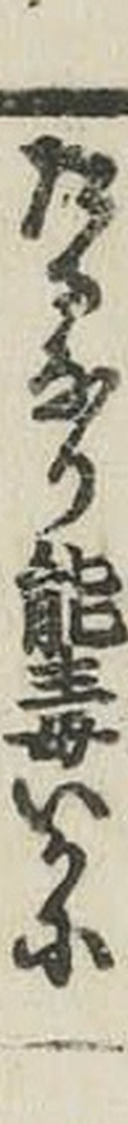たるなり能毒いかに
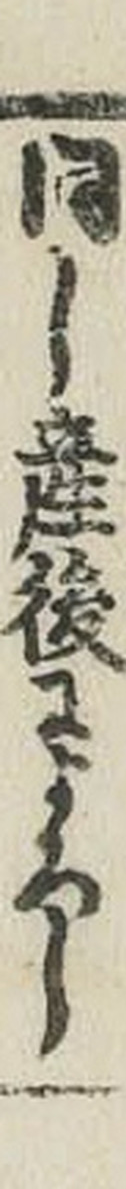同し産後によろし
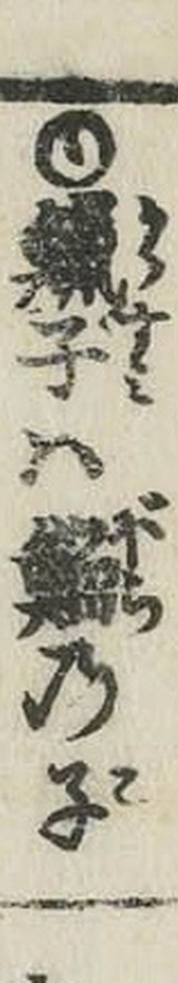○鱲子は鯔の子
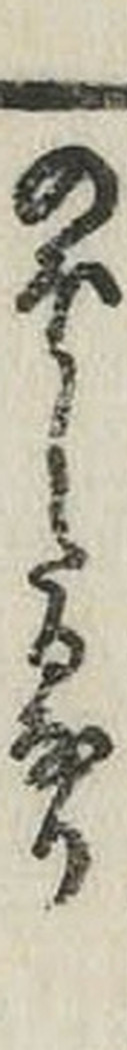のほしたるなり
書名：増補頭書訓蒙図彙大成 10巻 7:巻之14-16
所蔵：東京学芸大学教育コンテンツアーカイブ
